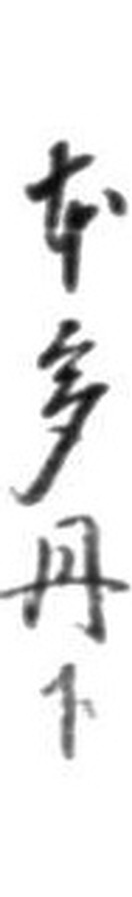本多丹下
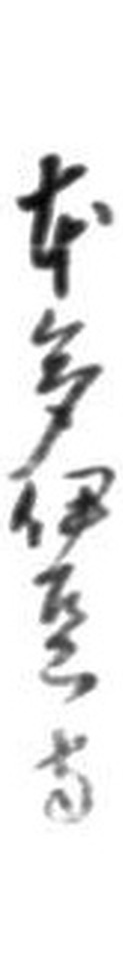本多伊豆守
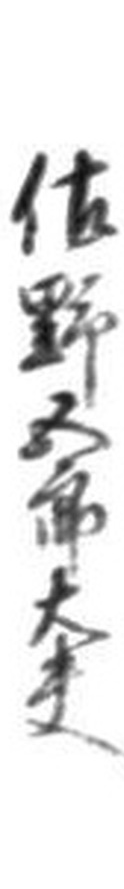佐野五郎大夫
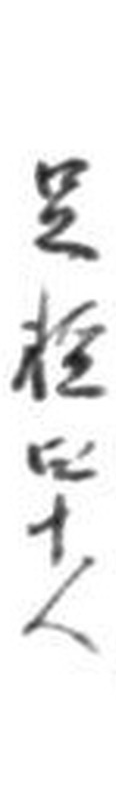足軽四十人
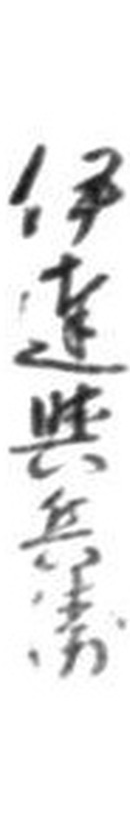伊達与兵衛

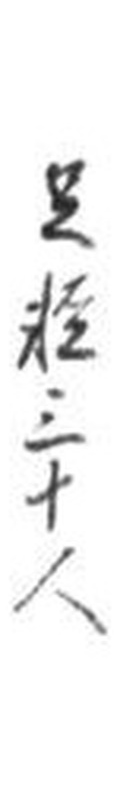足軽三十人
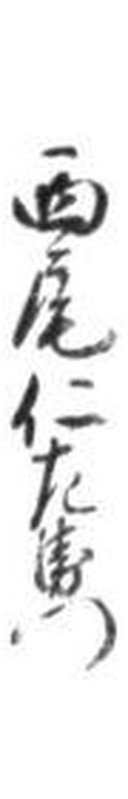西尾仁左衛門
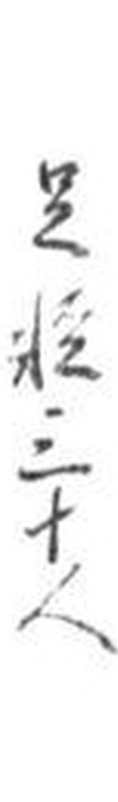足軽三十人
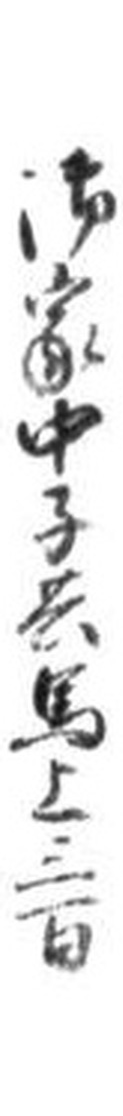御家中子共馬上三百
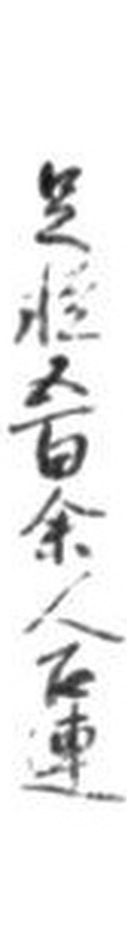足軽五百余人召連
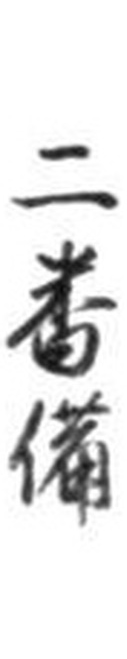二番備
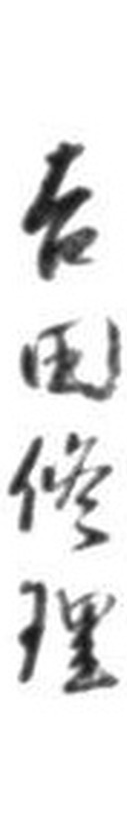吉田修理
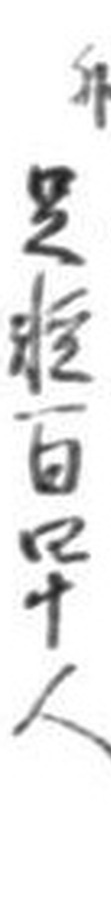外足軽百四十人
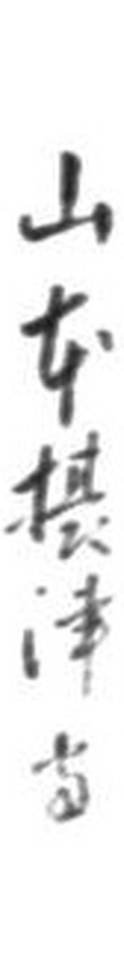山本摂津守
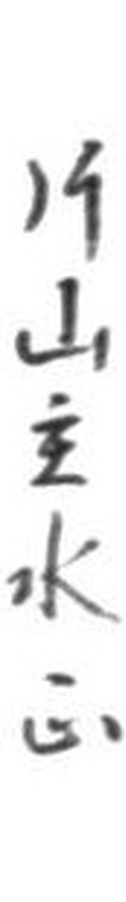片山主水正
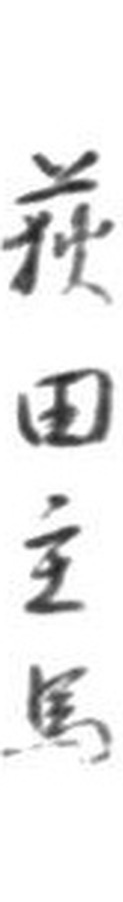荻田主馬
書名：家譜 二 忠直公 従文禄四年到慶安四年
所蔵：福井県文書館 Fukui Prefectural Archives
